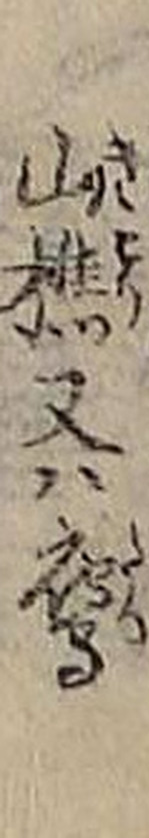山樵又は鷹
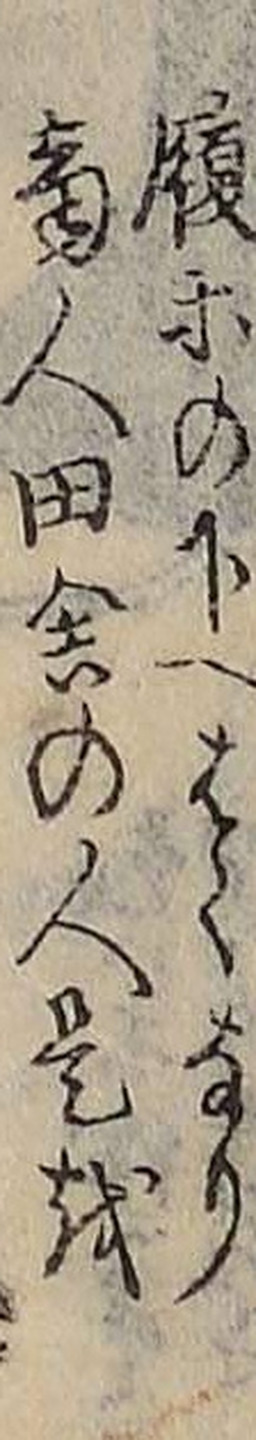商人田舎の人是を
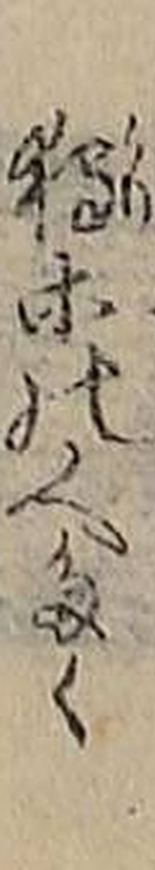狩等の人多く
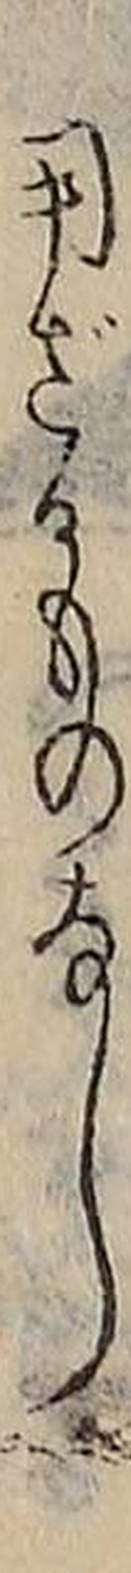用ざるものなし
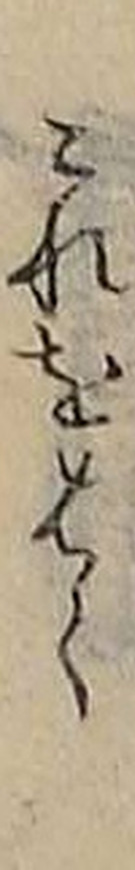これをはく
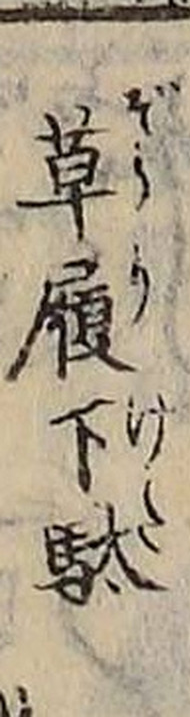草履下駄
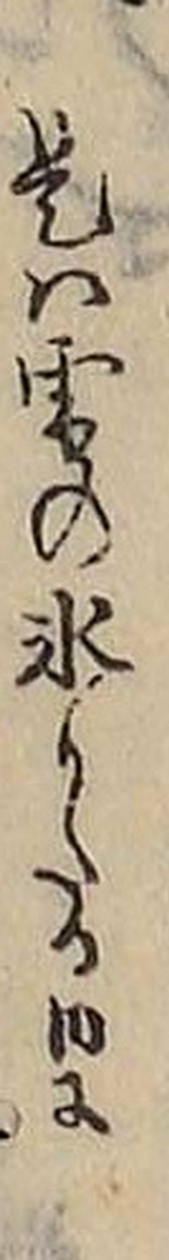是は雪の氷りたる日に
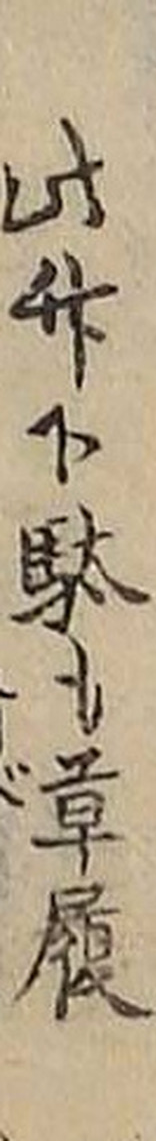此竹下駄も草履
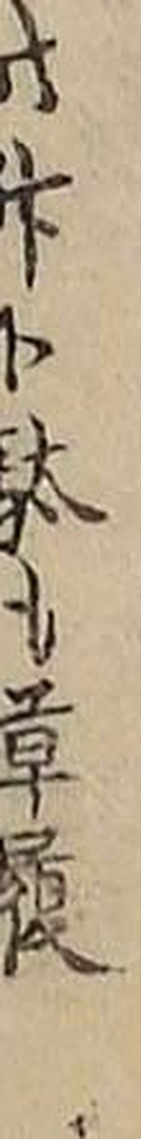此竹下駄も草履
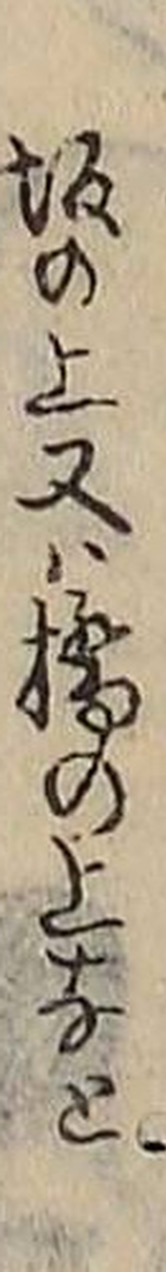坂の上又は橋の上なと
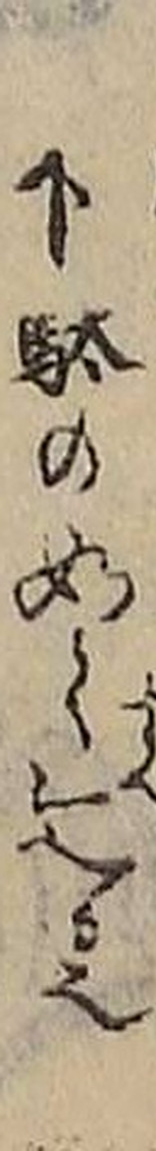下駄の如く辷る也
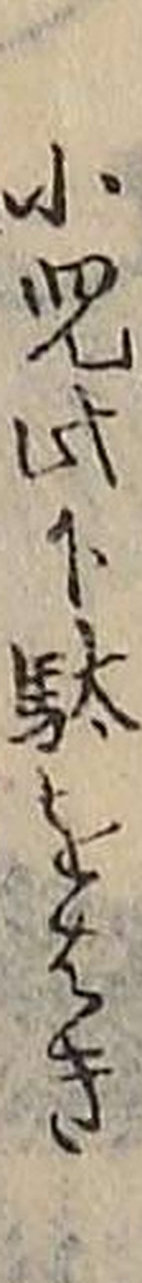小児此下駄をはき
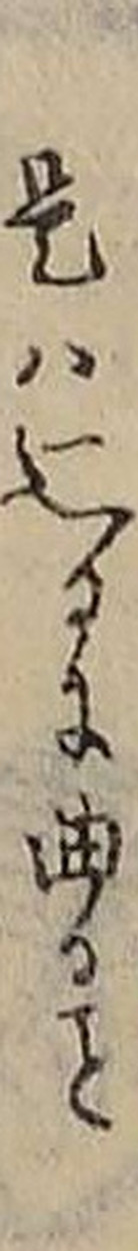是は辷るに曲ること
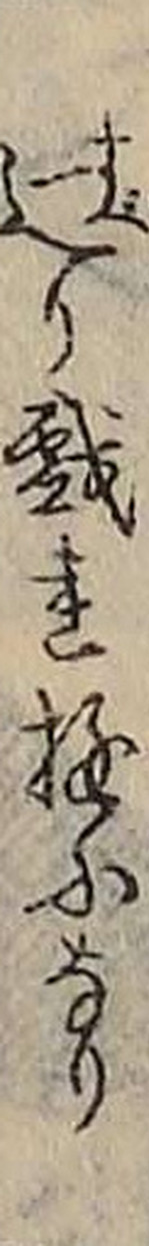辷り戯れ遊ふなり
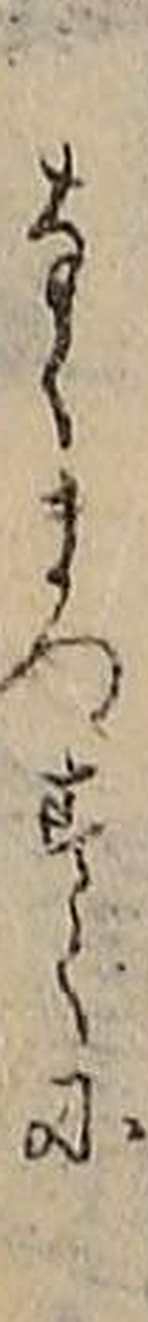なくまつすくに
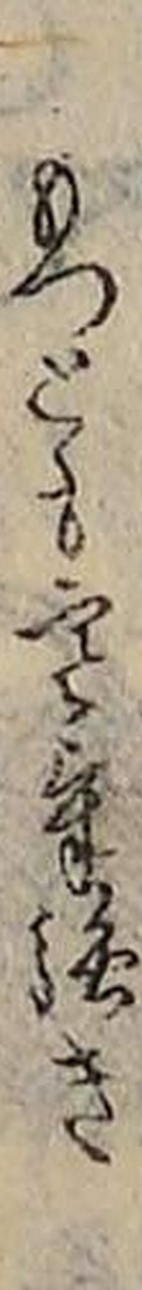もつとも寒気強き
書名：旅行用心集
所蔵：神戸大学附属図書館 国文学研究資料館
